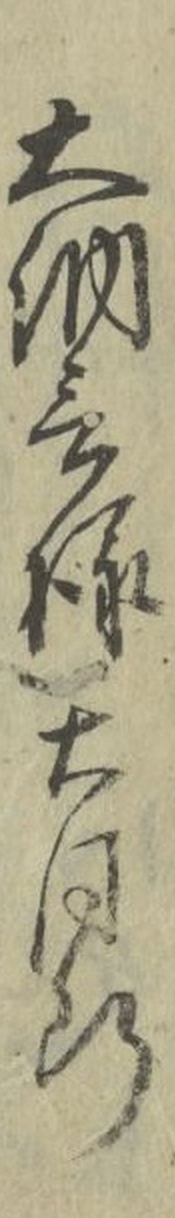大納言様右同断
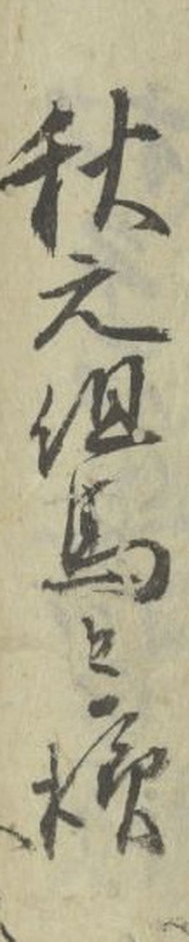秋元但馬守
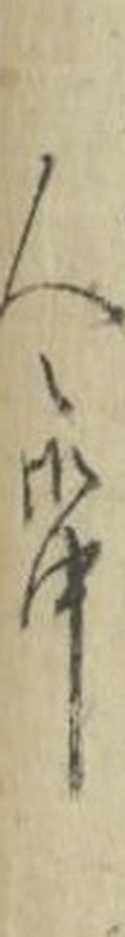人々御中
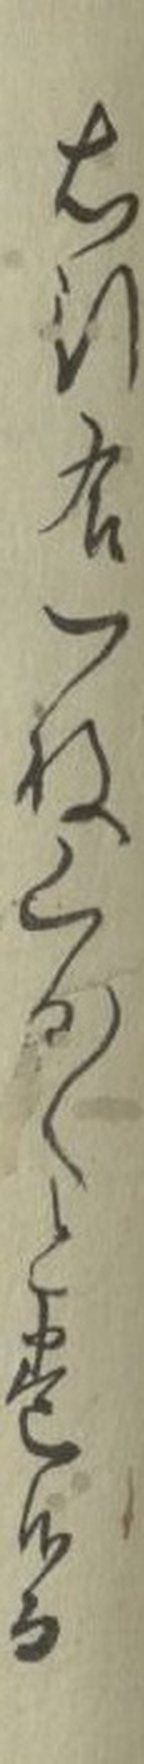右行合一枚くる〳〵と巻候間
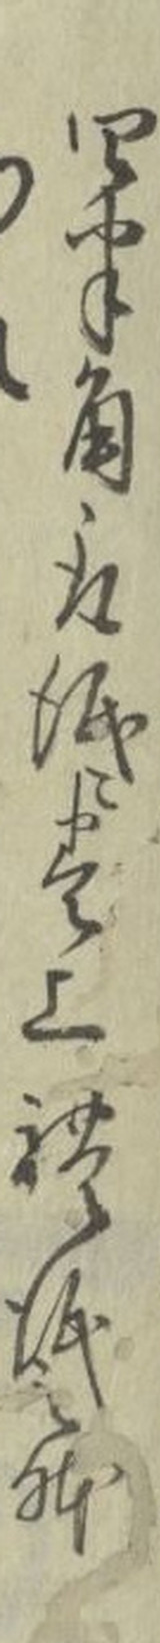四半角取紙に巻上礼紙之体
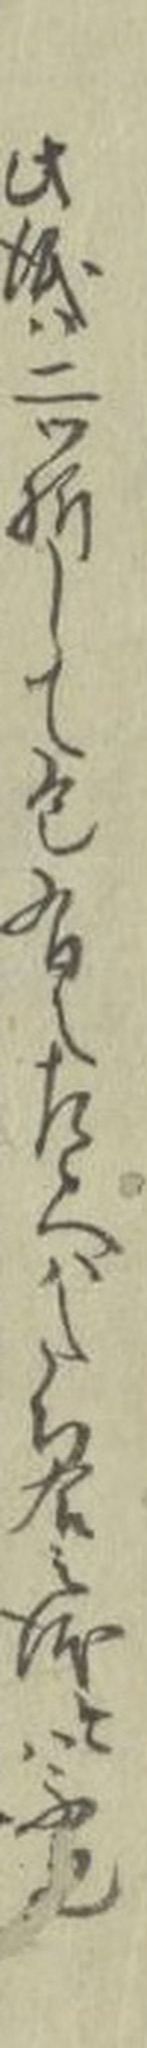此紙は二ツ折して包有之左候へはたち合之紙とは不見

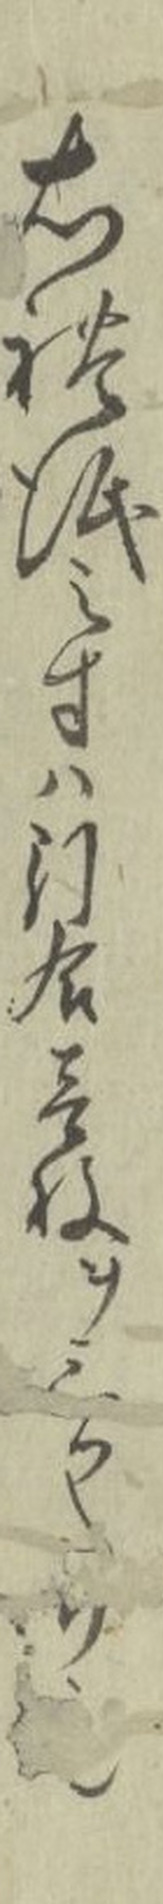右礼紙之寸は行合壱枚を三ツ之
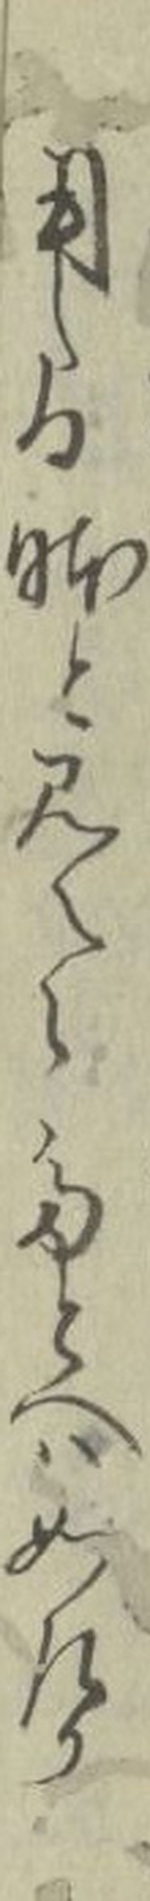用たる体と見へしたとへは如左か
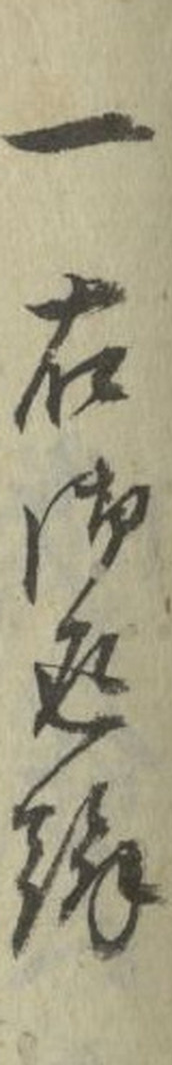一右御返翰
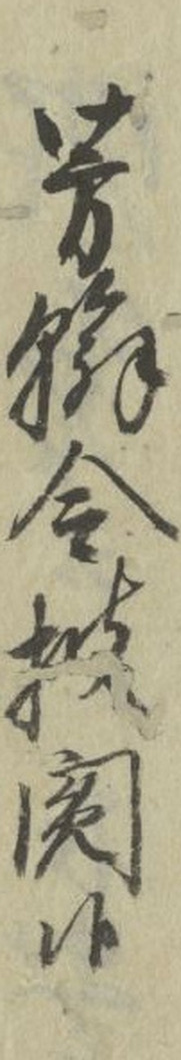芳翰令披閲候
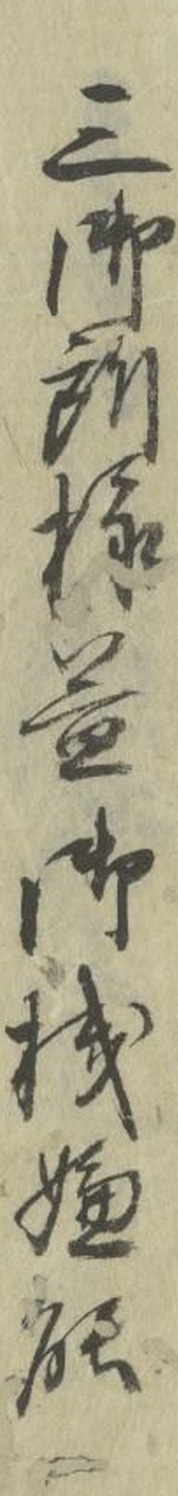三御所様益御機嫌能
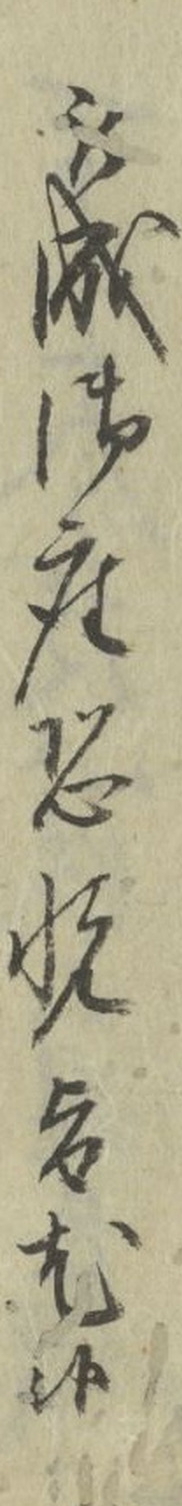被成御座恐悦旨尤候

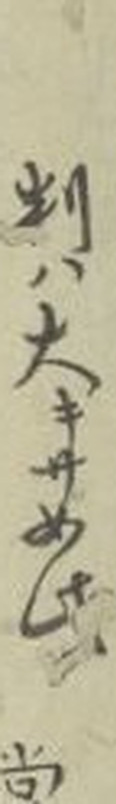判は大きさ如此

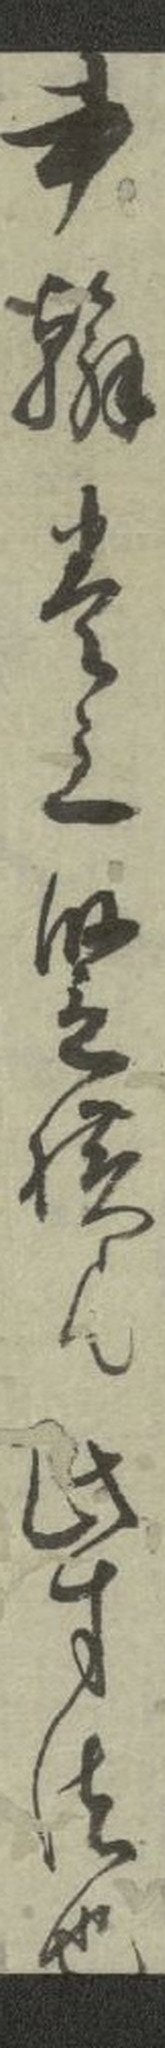書翰巻上竪横にて此寸法也
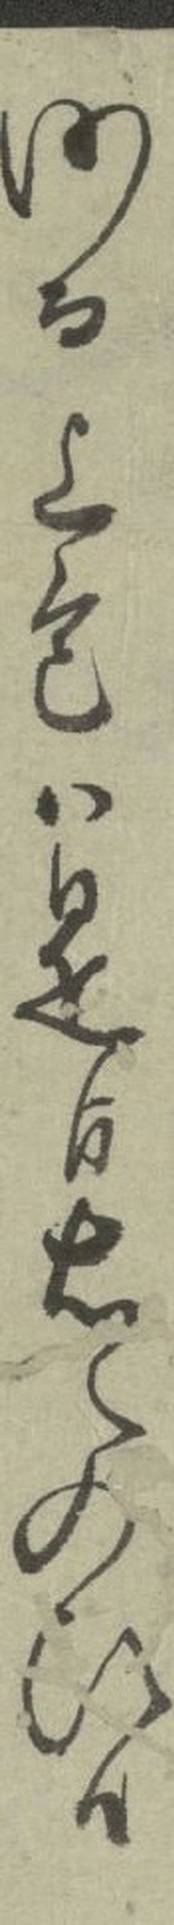仍而上包は是ゟ右へのひる

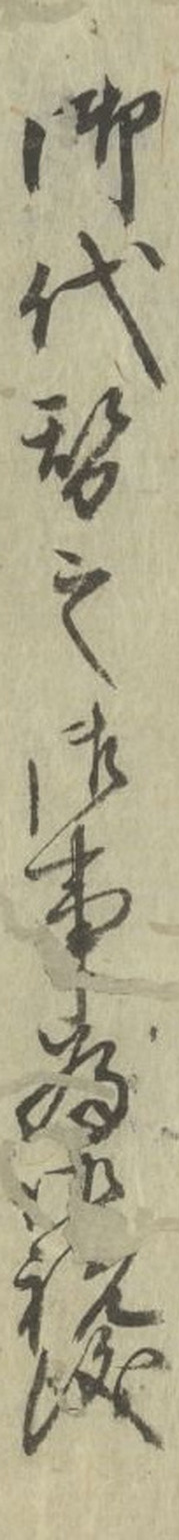御代替之御事為御祝儀
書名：琉球来朝記 自八至十四終
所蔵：University of the Ryukyus Library
